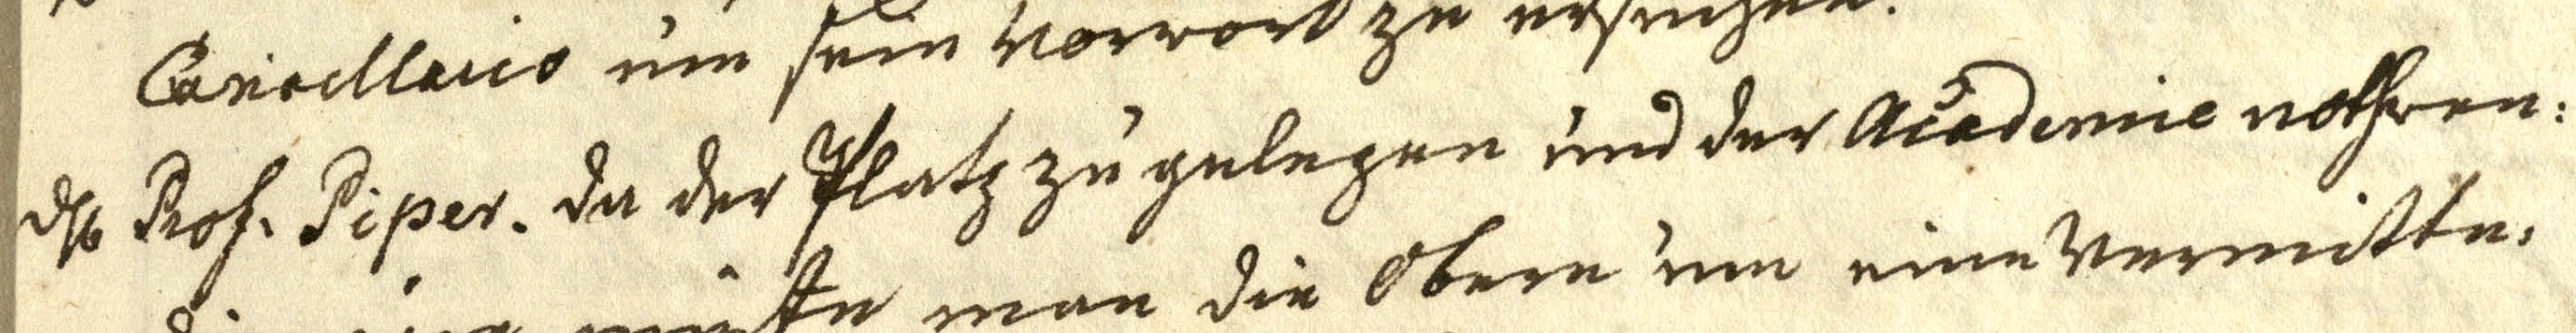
dh Prof. Piper. Da der Platz zu gelegen und der Academie nothwen¬
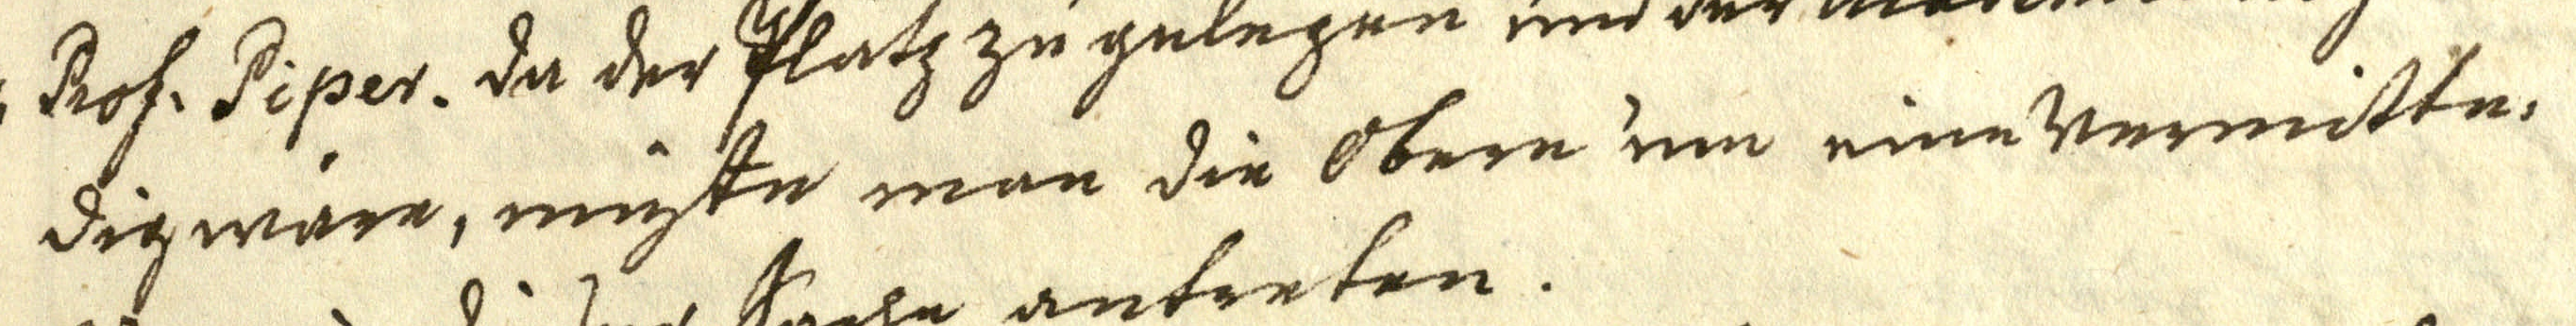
dig wäre, müste man die Obern um eine Vermitte¬
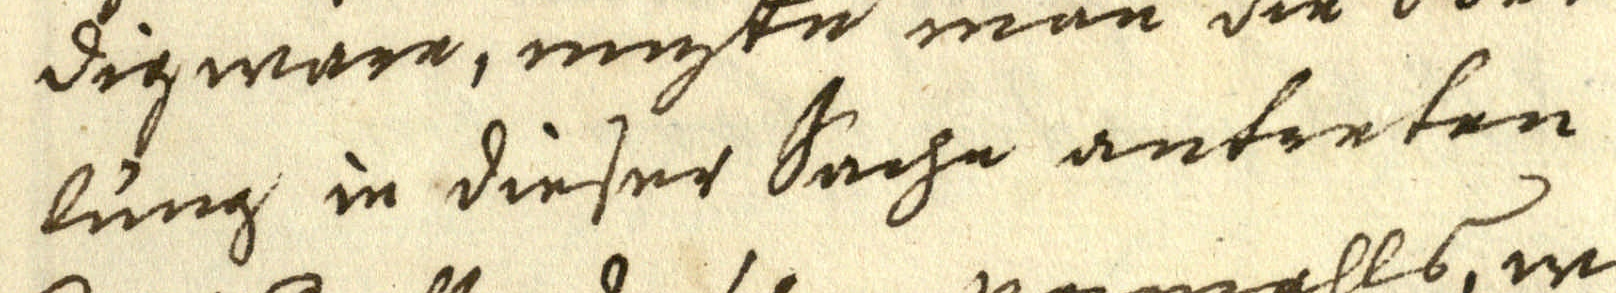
lung in dieser Sache antreten
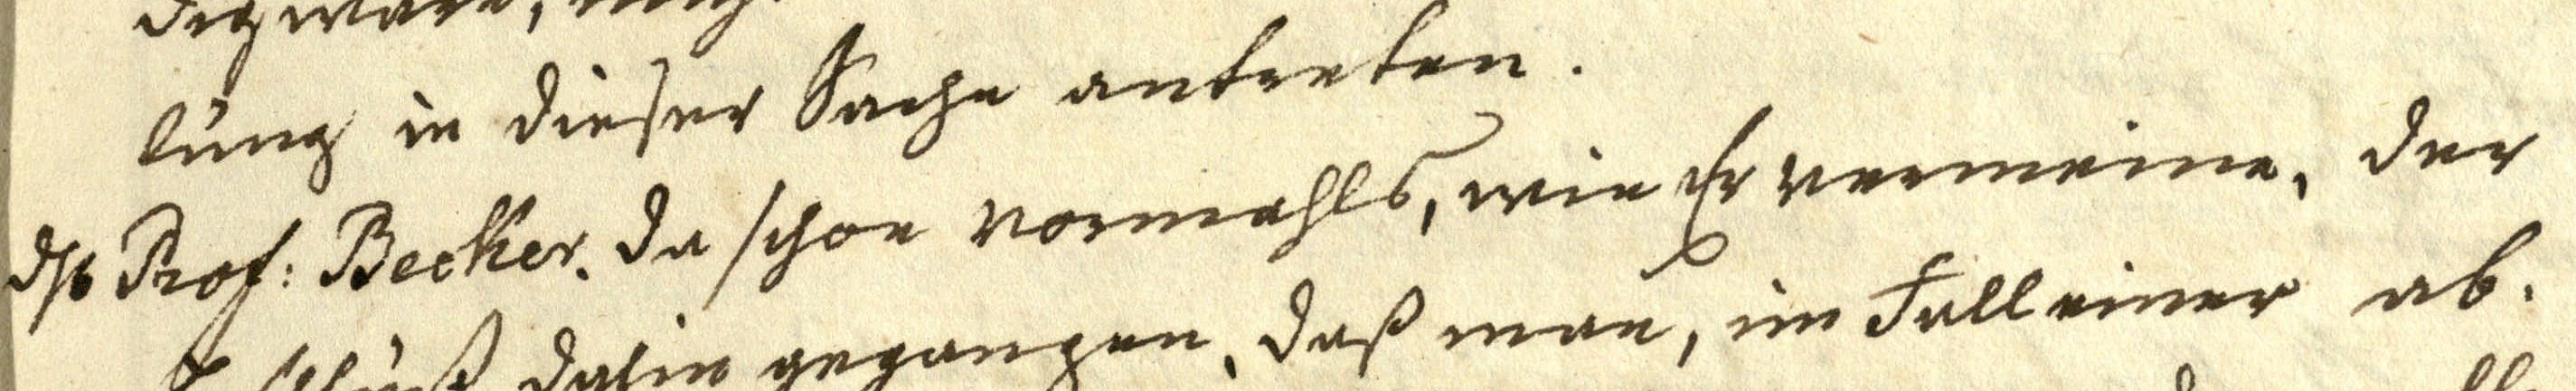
dh Prof. Becker. Da schon vormahls, wie Er vermeine, der
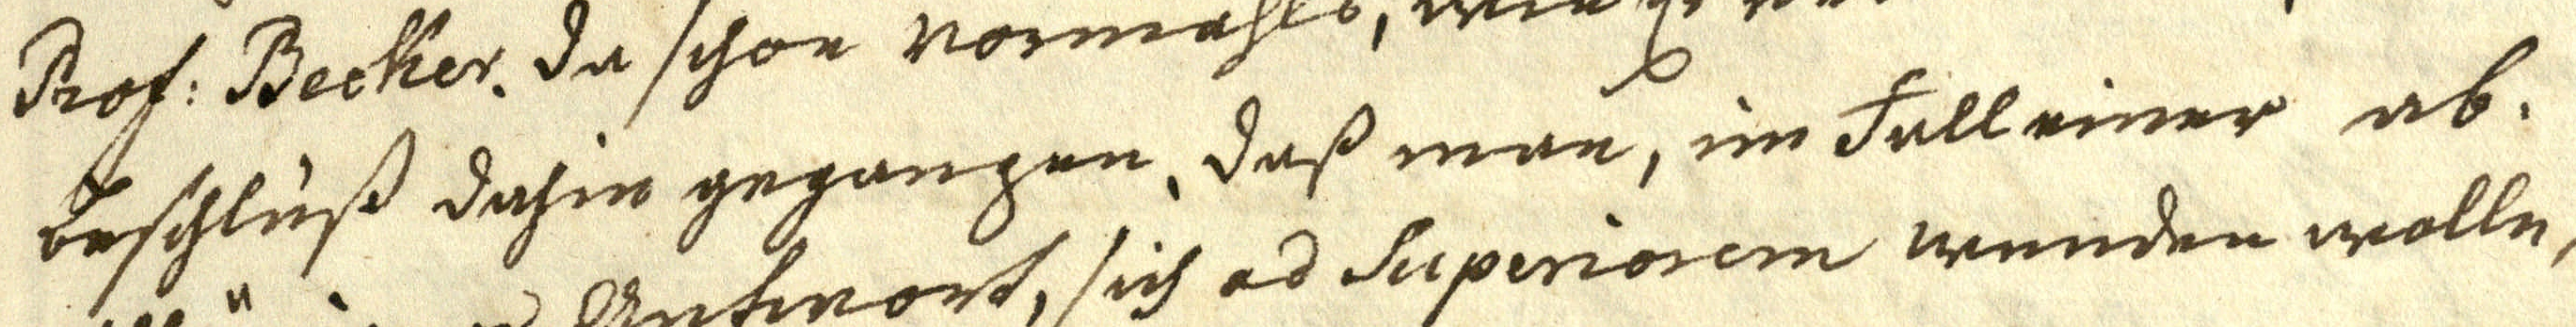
Beschluß dahin gegangen, daß man, im Fall einer ab¬
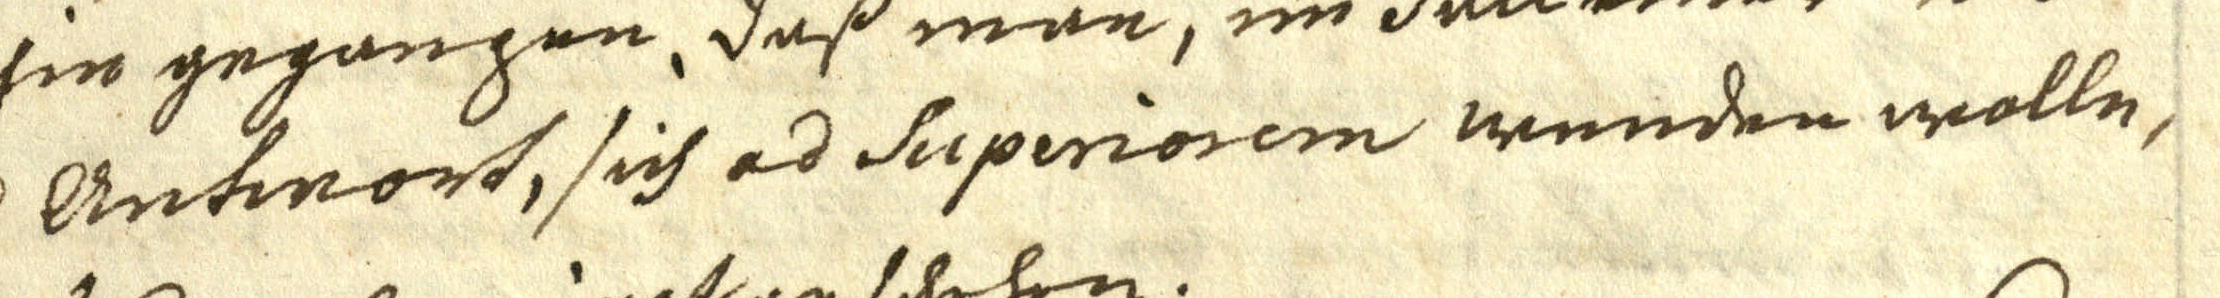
schlägigen Antwort, sich ad Superiorum wenden wolle,
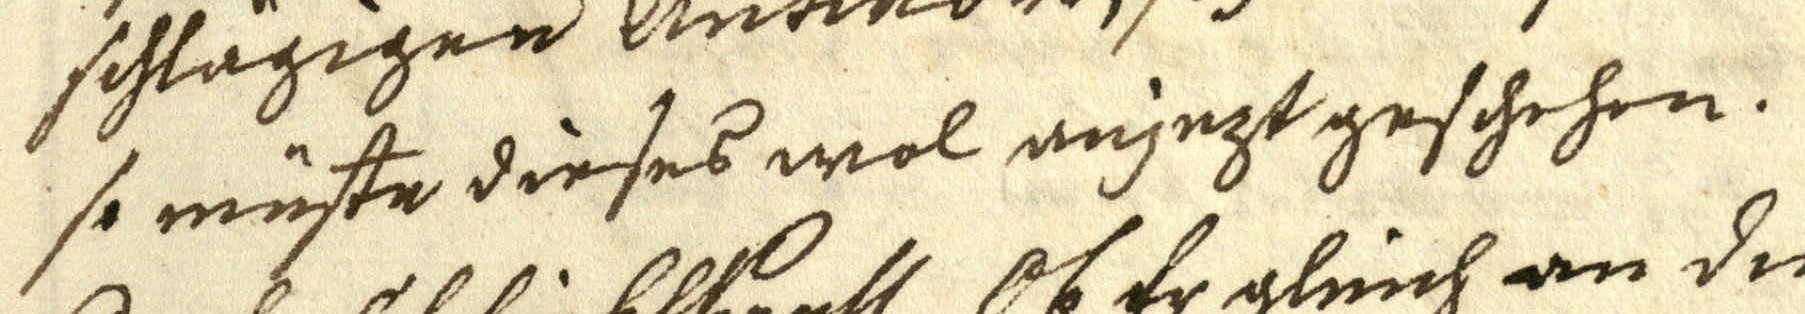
so müßte dieses wol anjezt geschehen.
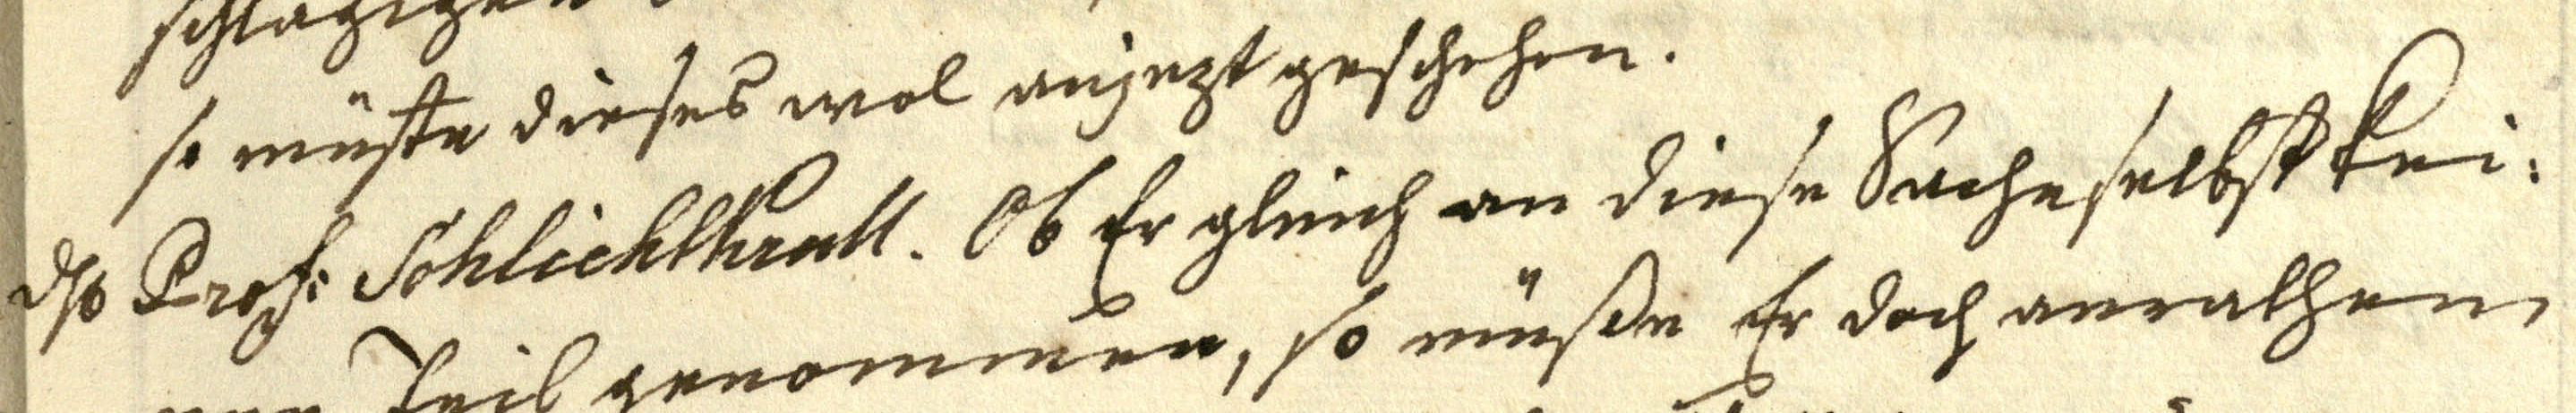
dh. Prof. Schlichtkrull. Ob Er gleich an diese Sache selbst kei¬
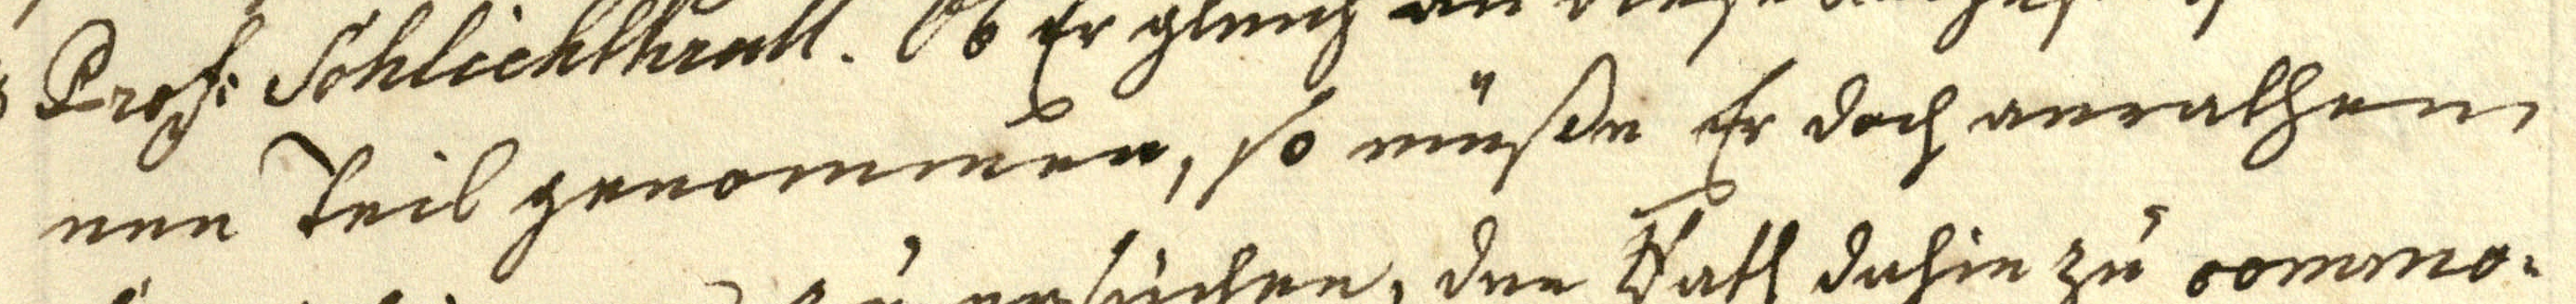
nen Teil genommen, so müße Er doch anrathen,
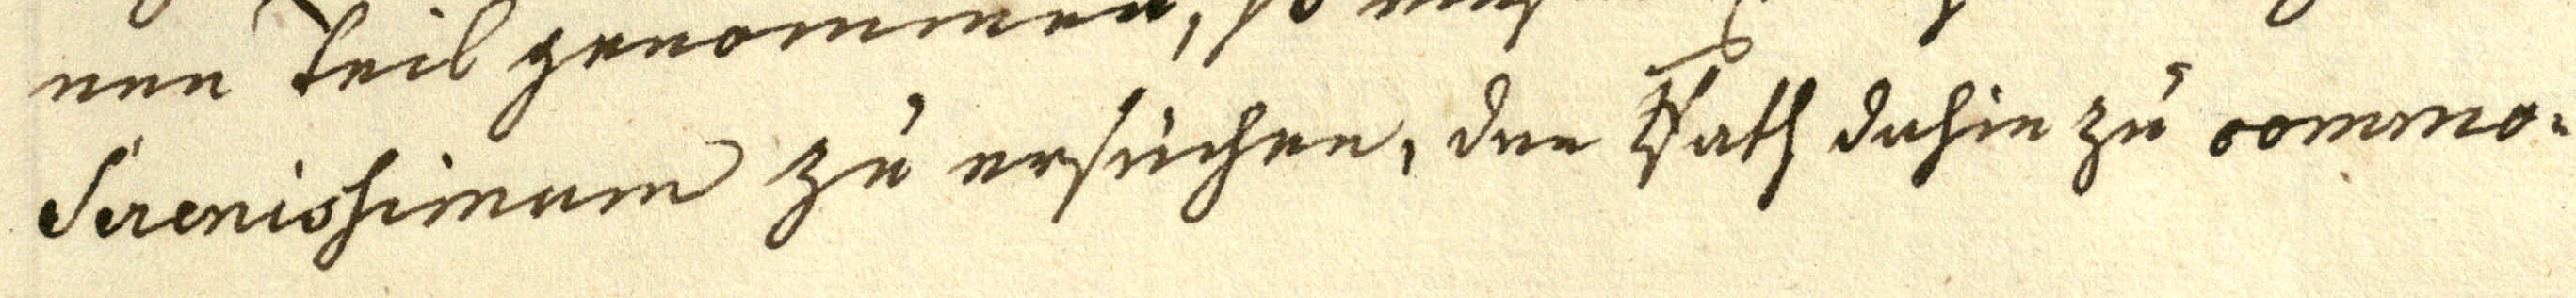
Serenissimum zu ersuchen, den Rath dahin zu commo¬
